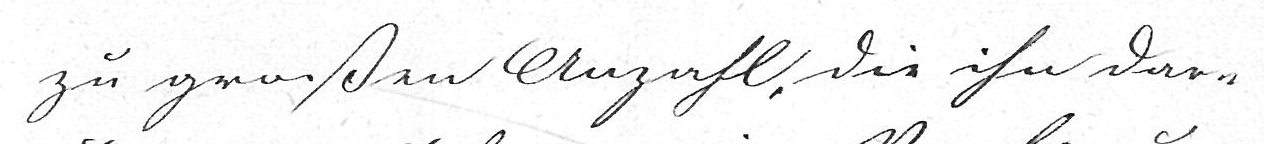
zu großen Anzahl, die ihn dar-
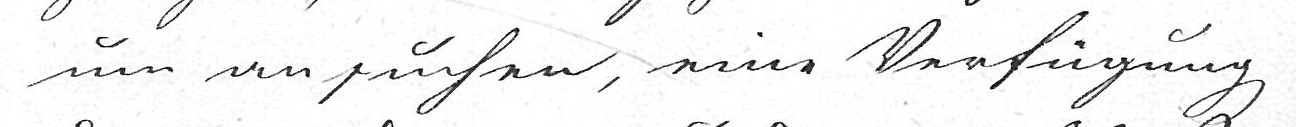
um ansuchen, eine Verfügung
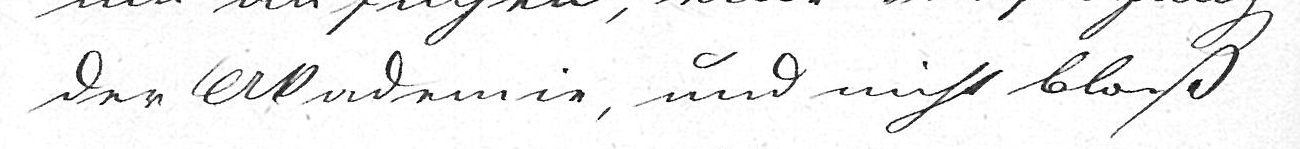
der Akademie, und nicht bloß
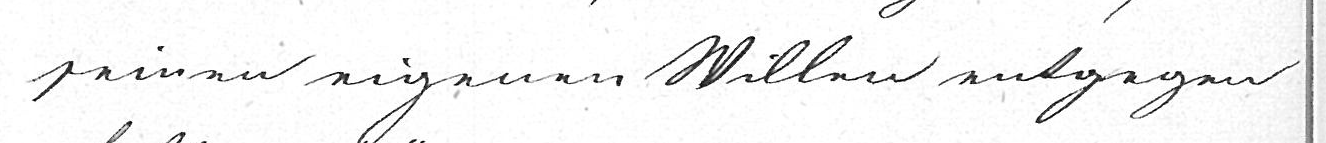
seinen eigenen Willen entgegen-
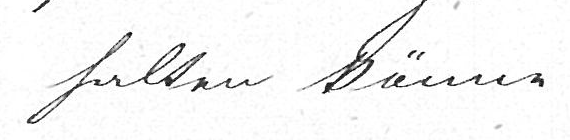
halten könne.
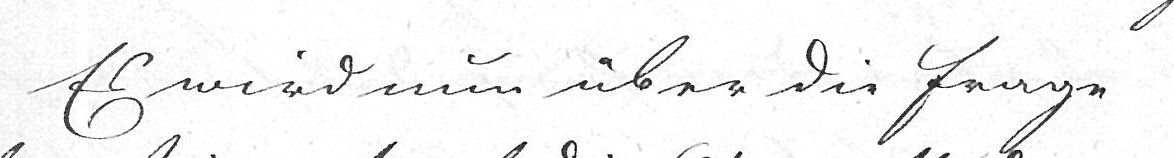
Es wird nun über die Frage
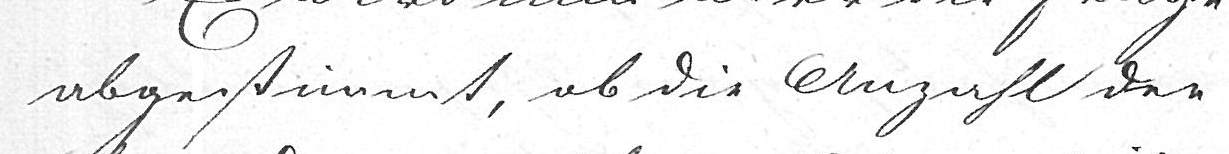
abgestimmt, ob die Anzahl der
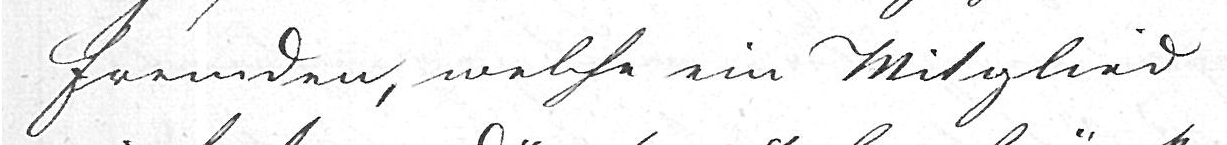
Fremden, welche ein Mitglied
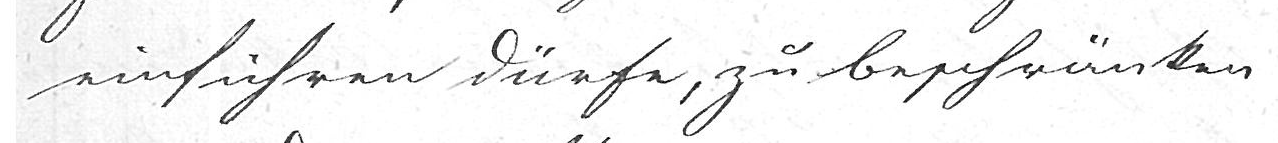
einführen dürfes, zu beschränken
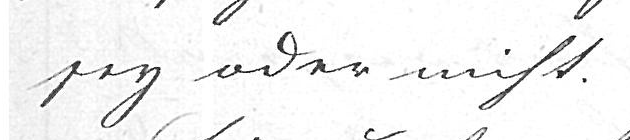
sey oder nicht.
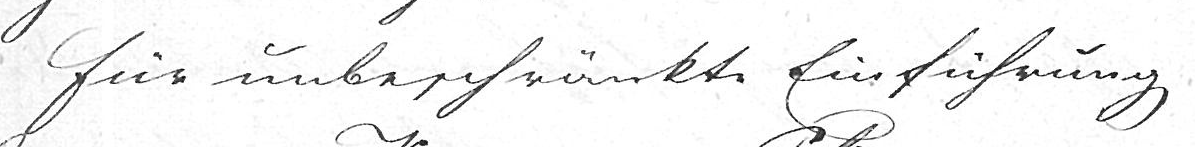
Für unbeschränkte Einführung
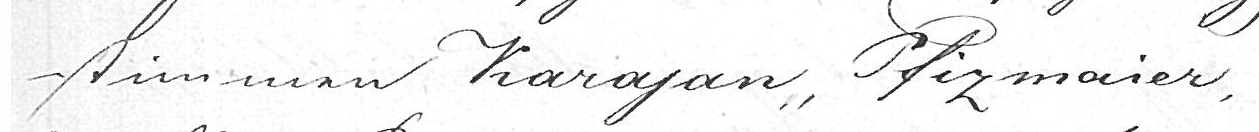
stimmen Karajan Pfizmaier,
